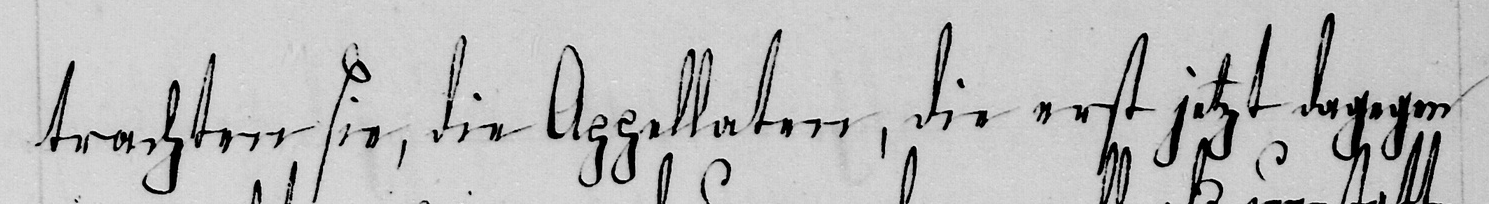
trachten sie, die Appellaten, die erst jetzt dagegen
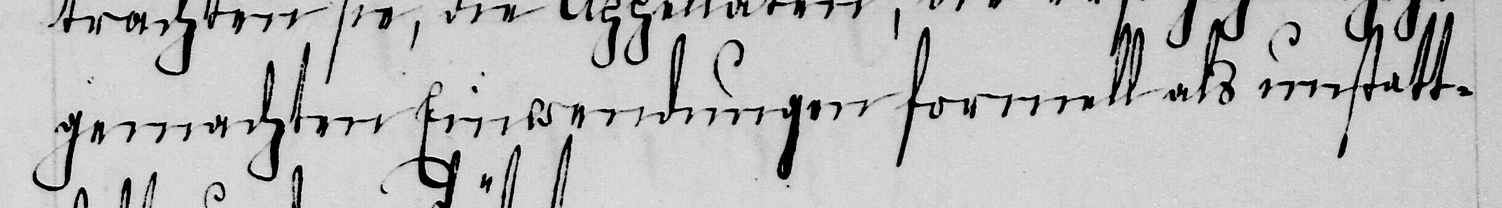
gemachten Einwendungen formell als unstatt¬
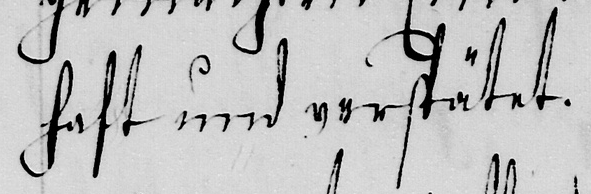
haft und verspätet.
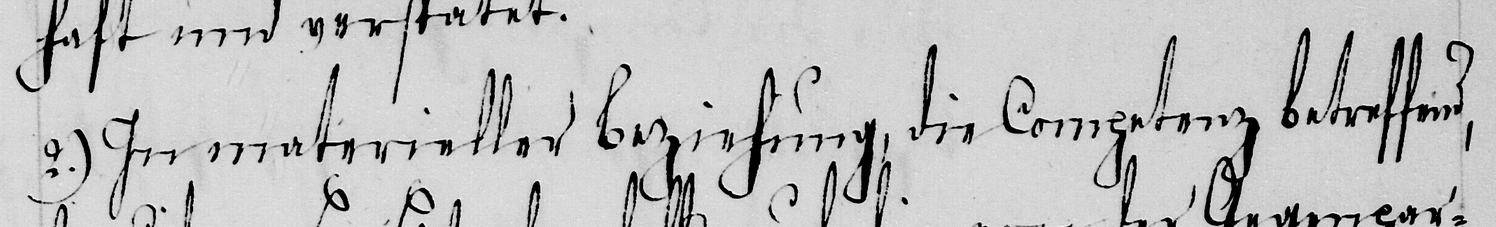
2.) In materieller Beziehung, die Competenz betreffe¬
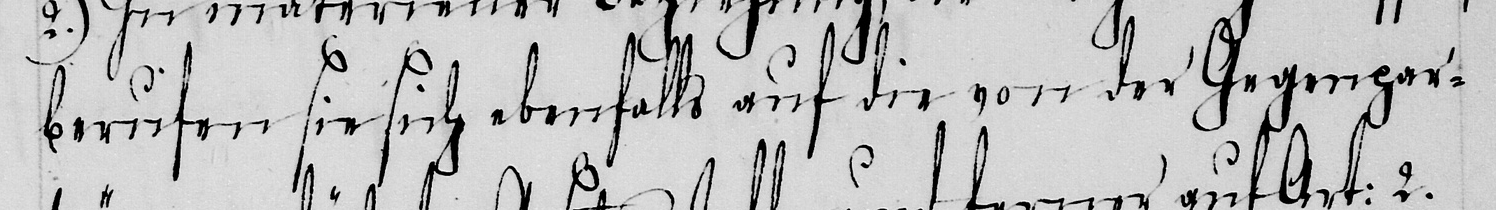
berufen sie sich ebenfalls auf die von der Gegenpar¬
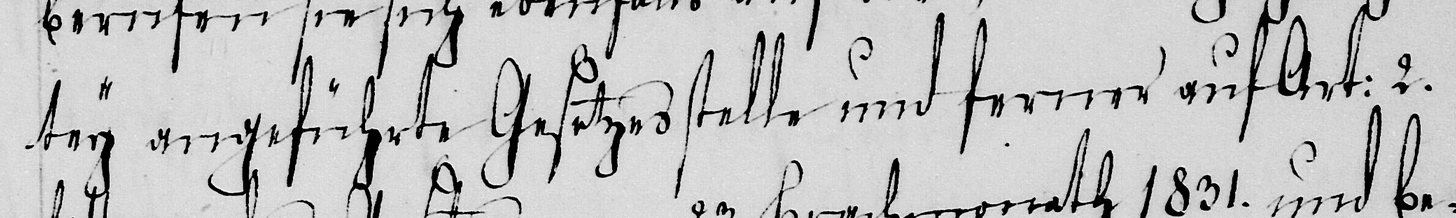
tey angeführte Gesetzesstelle und ferner auf Art: 2.
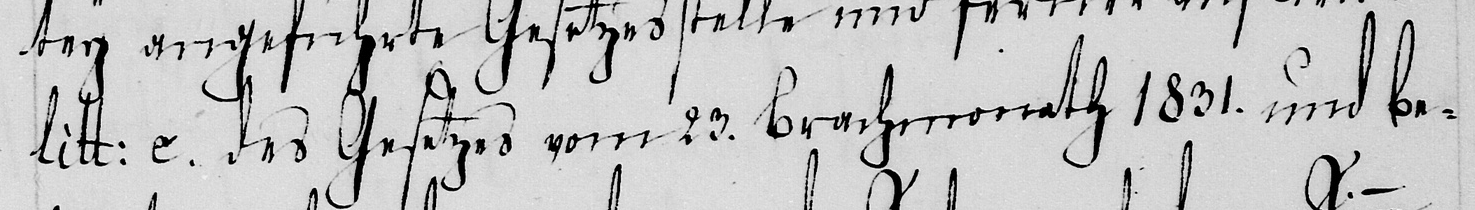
litt: e. des Gesetzes vom 23. Brachmonath 1831. und be¬
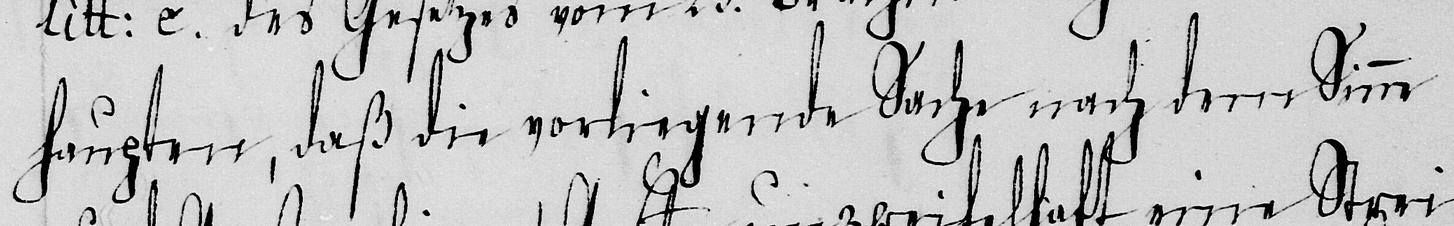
haupten, daß die vorliegende Sache nach dem Sinne
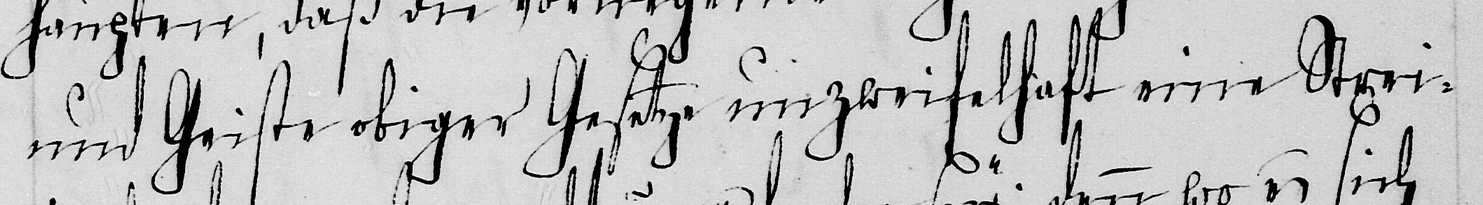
und Geiste obiger Gesetze unzweifelhaft eine Strei¬
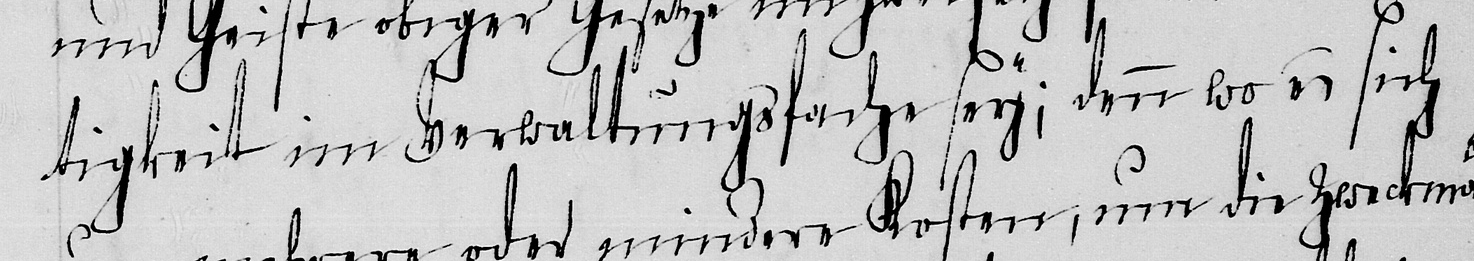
tigkeit im Verwaltungsfache sey; denn wo es sich
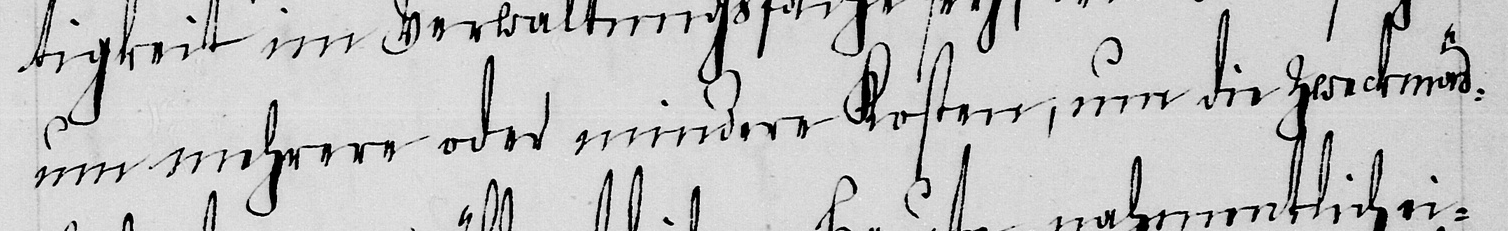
um mehrere oder mindere Kosten, um die Zweckmäß¬
